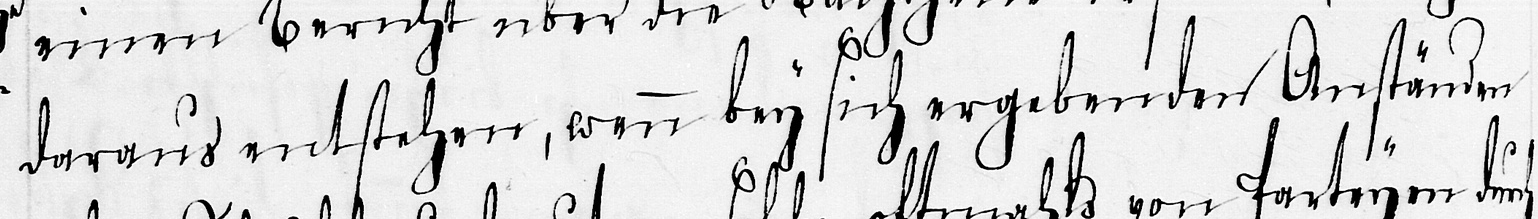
daraus entstehen, wenn bey sich ergebenden Anständen
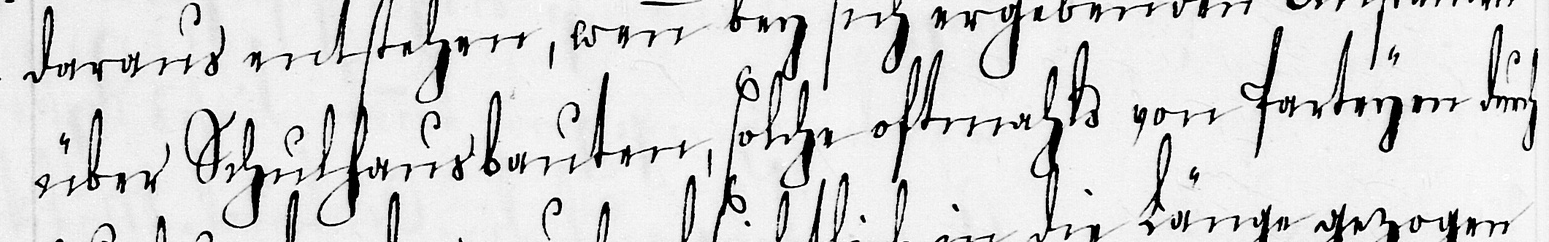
über Schulhausbauten, solche oftmahls von Parteyen d¬
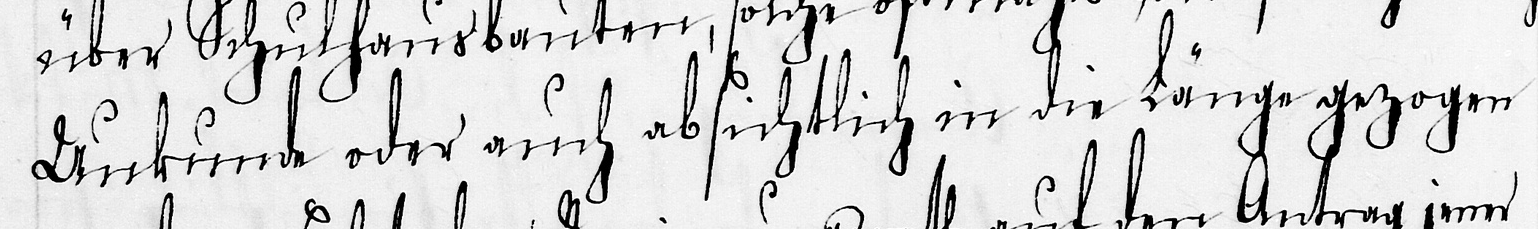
Urkunde oder auch absichtlich in die Länge gezogen
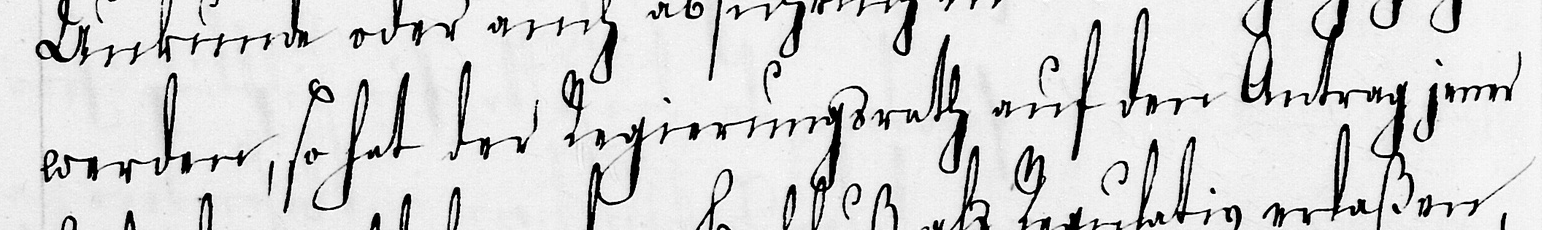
werden, so hat der Regierungsrath auf den Antrag jener
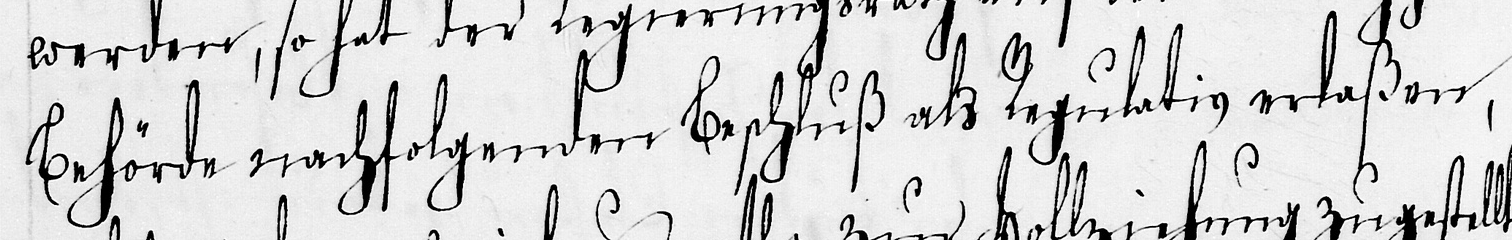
Behörde nachfolgenden Beschluß als Regulativ erlaßen,
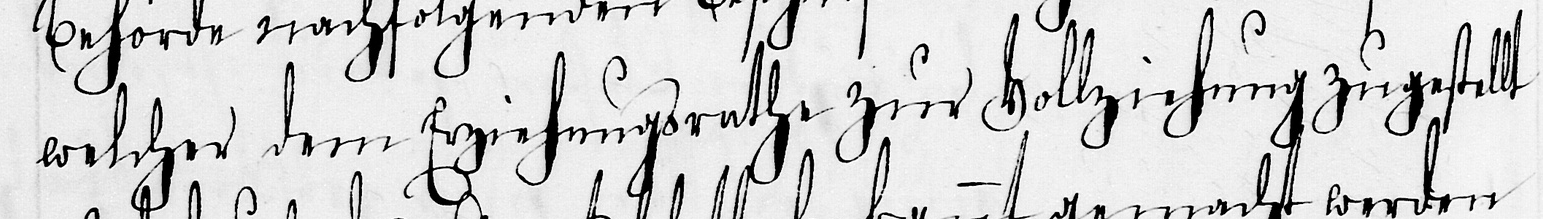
welcher dem Erziehungsrathe zur Vollziehung zugestel¬
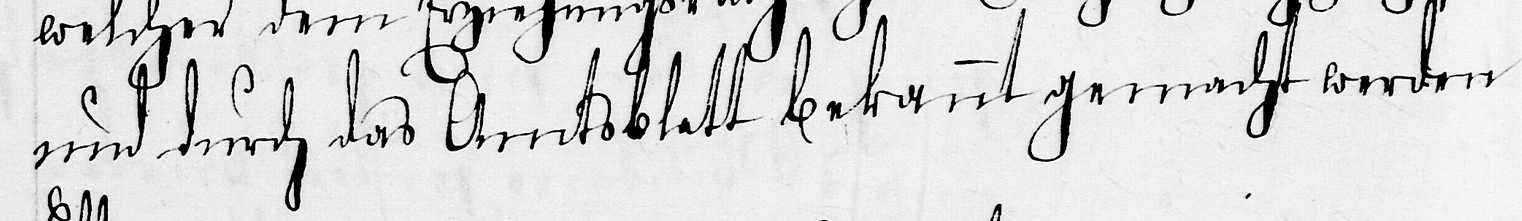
und durch das Amtsblatt bekannt gemacht werden
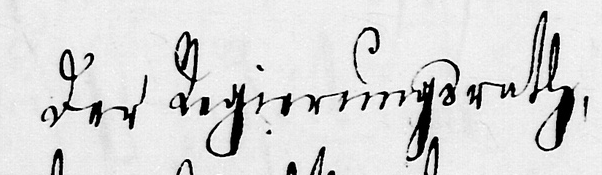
Der Regierungsrath,
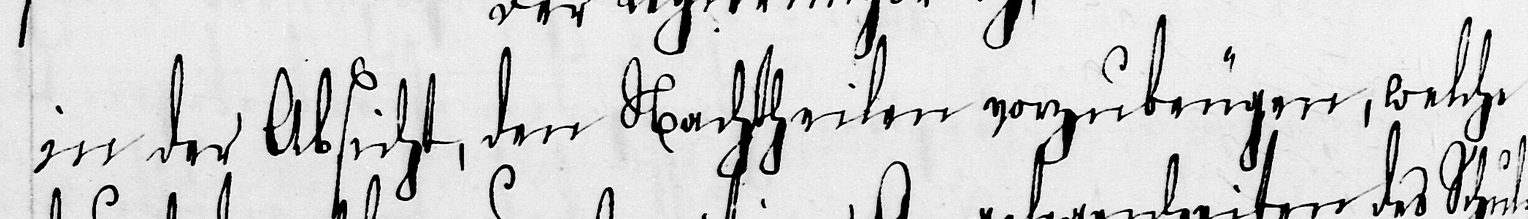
in der Absicht, den Nachtheilen vorzubeugen, welche
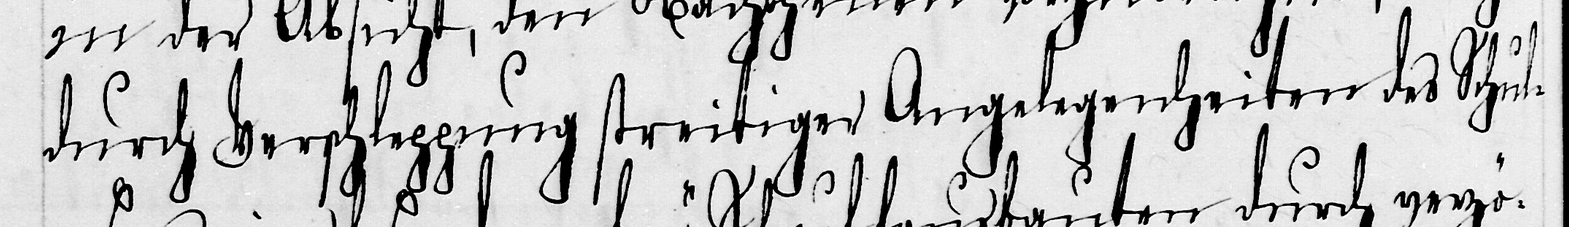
durch Verschleppung streitiger Angelegenheiten des Schu¬
